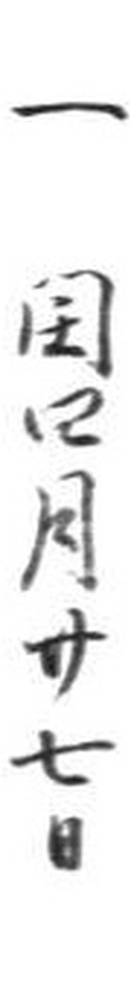一閏四月廿七日
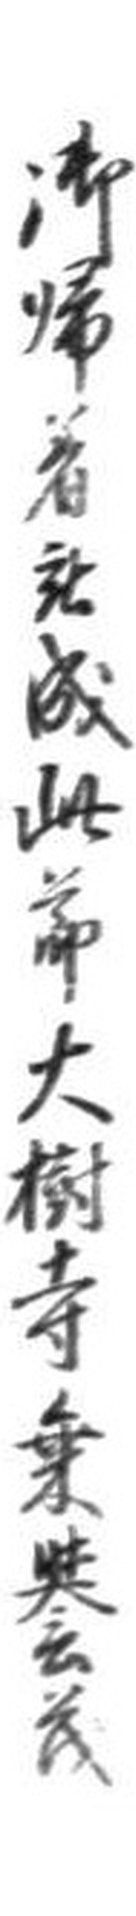御帰着被成此節大樹寺乗誉も
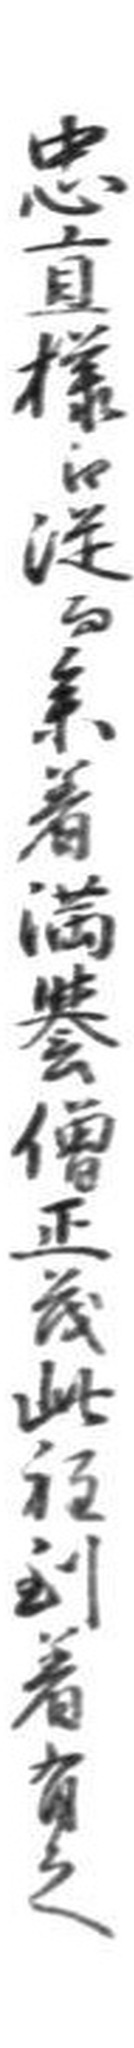忠直様江従而参着満誉僧正も此程到着有之
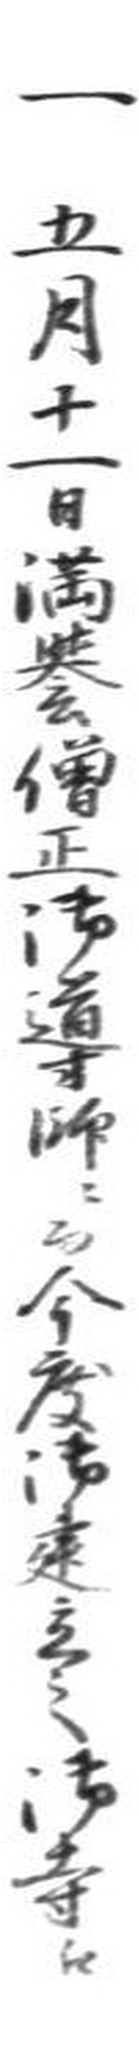一五月十一日満誉僧正御導師ニ而今度御建立之御寺江

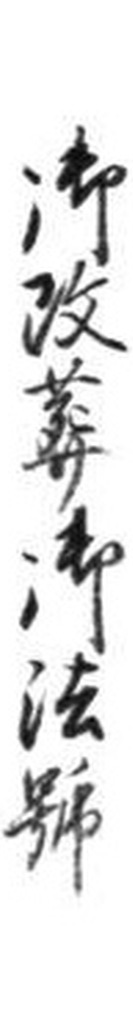御改葬御法号
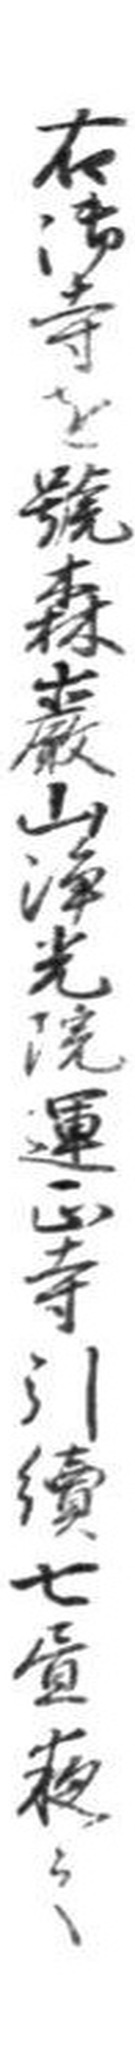右御寺を号森巌山浄光院運正寺引続七昼夜之
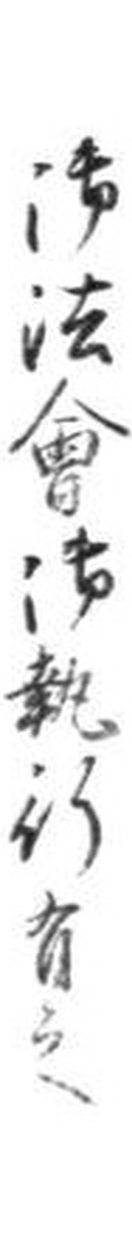御法会御執行有之
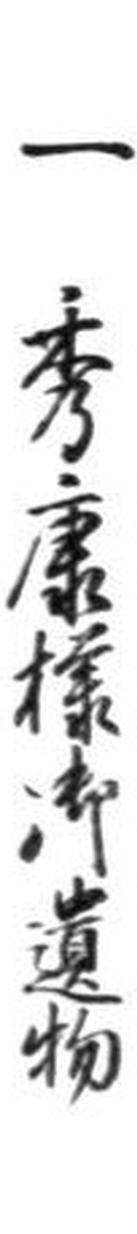一秀康様御遺物
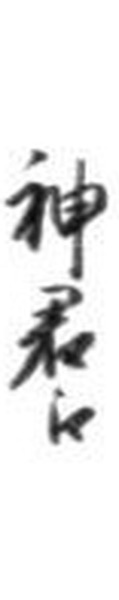神君江
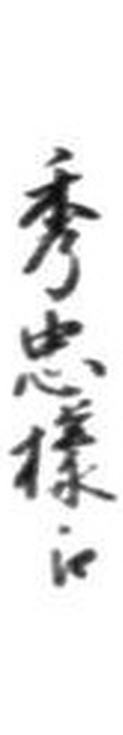秀忠様江
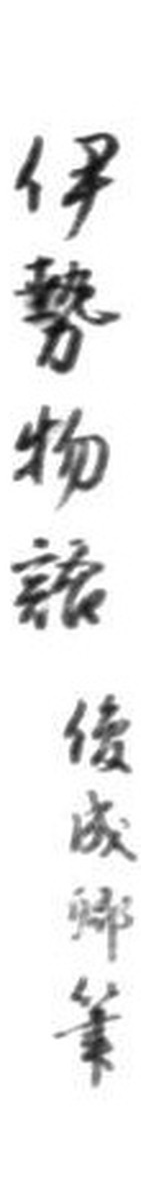伊勢物語俊成卿筆

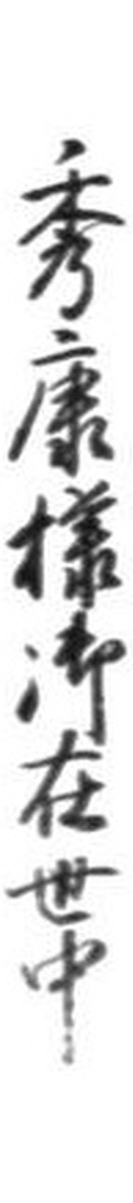秀康様御在世中
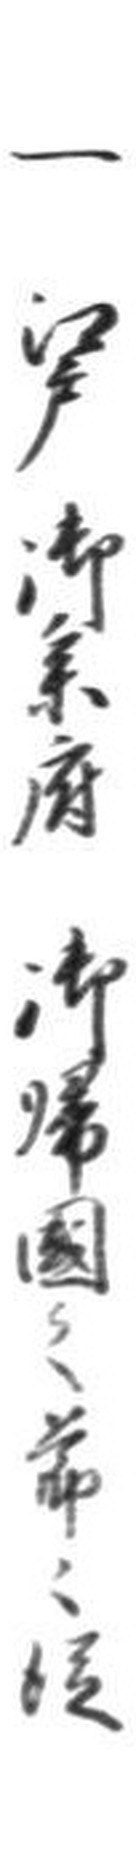一江戸御参府御帰国之節々従
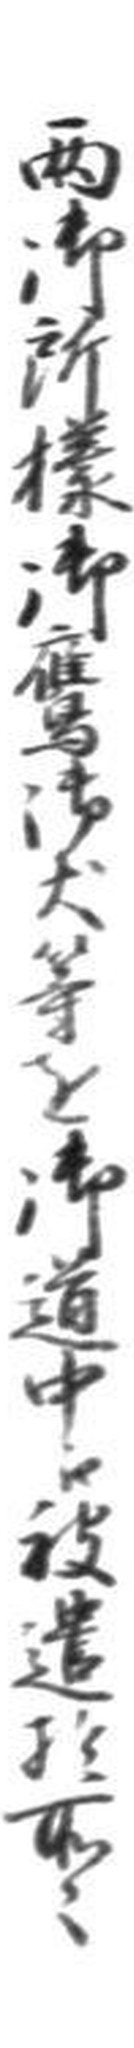両御所様御鷹御犬等を御道中江被遣於所々
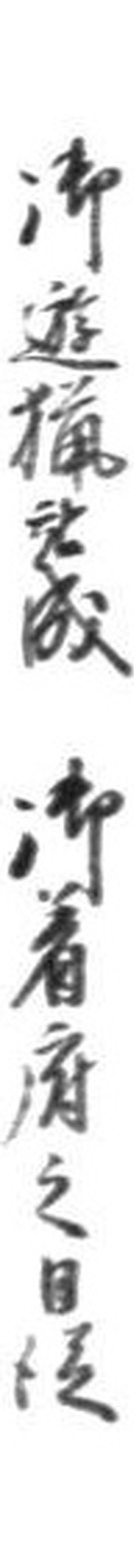御遊猟被成御着府之日従
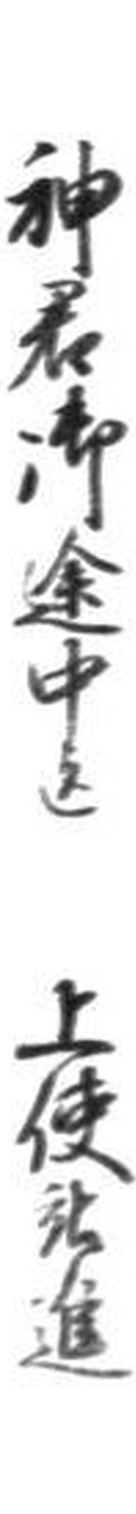神君御途中迄上使被進
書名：家譜 一 秀康公 従天正二年到慶長十二年
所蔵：福井県文書館 Fukui Prefectural Archives
